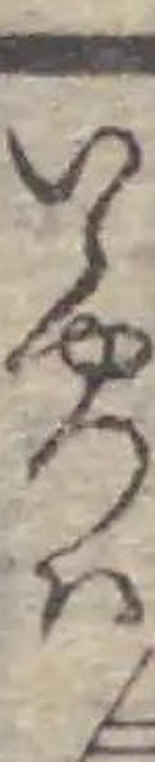いゝやつは
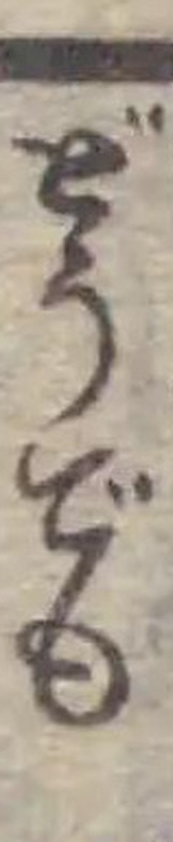どうでも
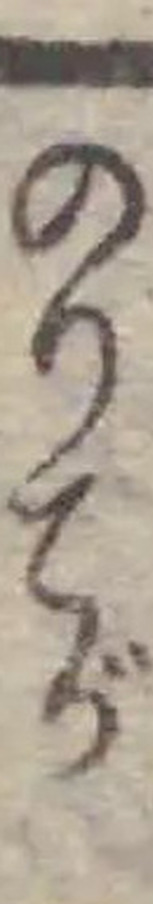のりてが
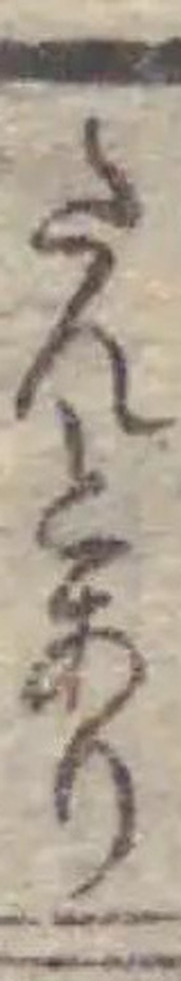たんとあり
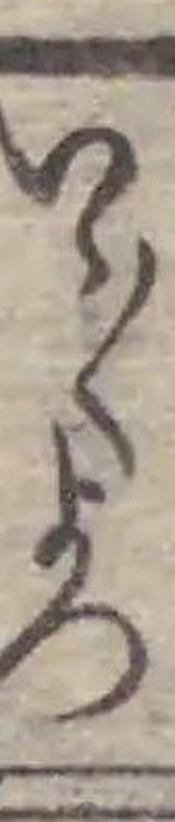いゝ〳〵よつ
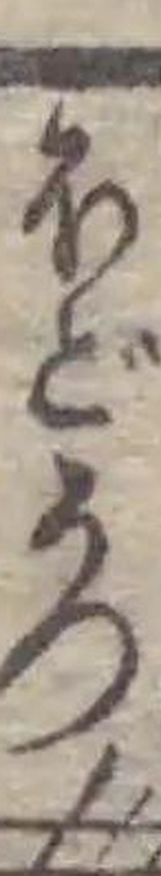ほどうつ
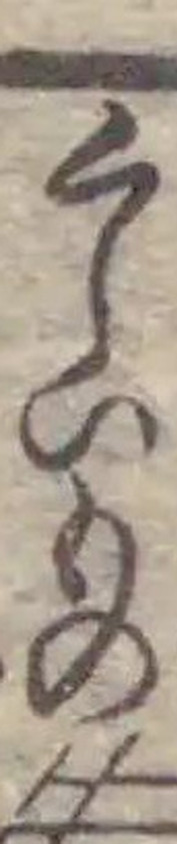くしいもの
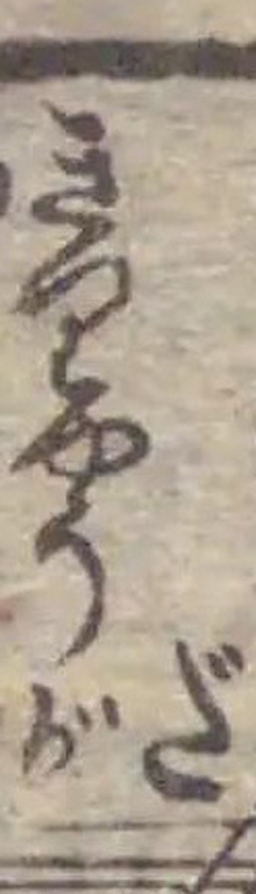きりやうが
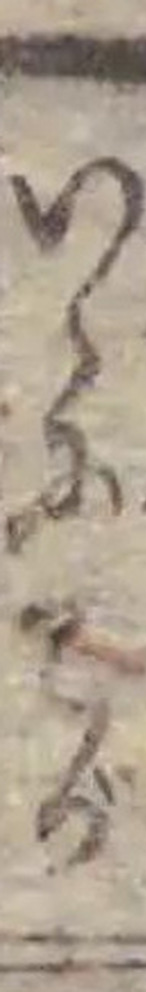いゝにりが

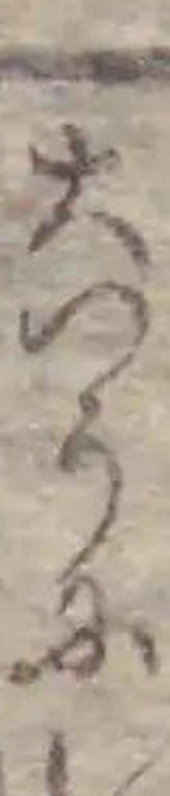大つうに
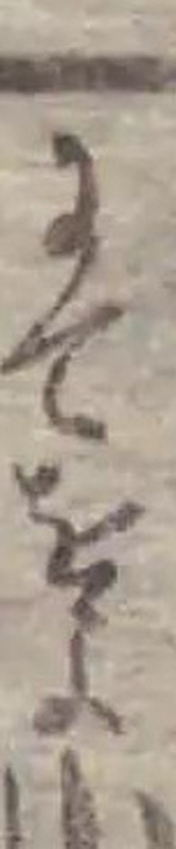にてをよ
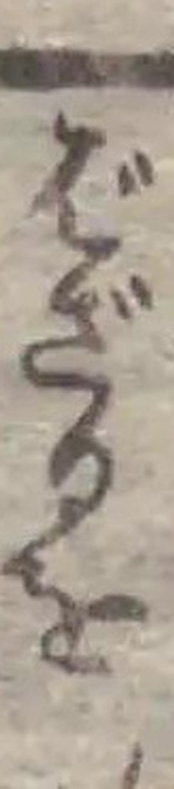ばざるを
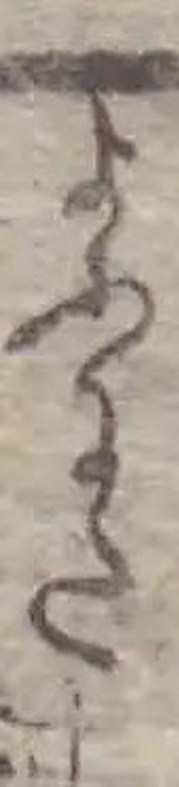よふにた
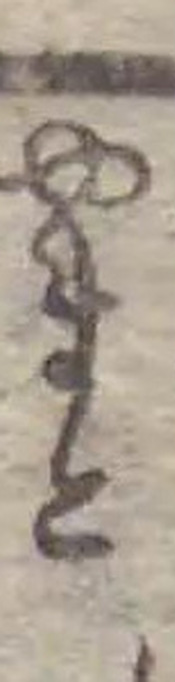やまと
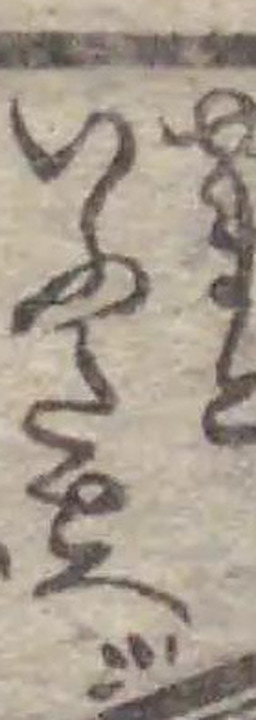いふたとへ
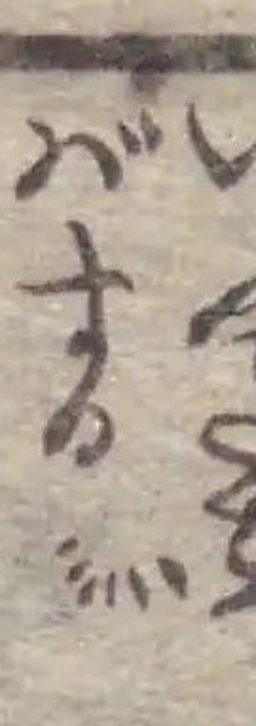ばする
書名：かんなんの夢枕 2巻
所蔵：国立国会図書館 National Diet Library, JAPAN
